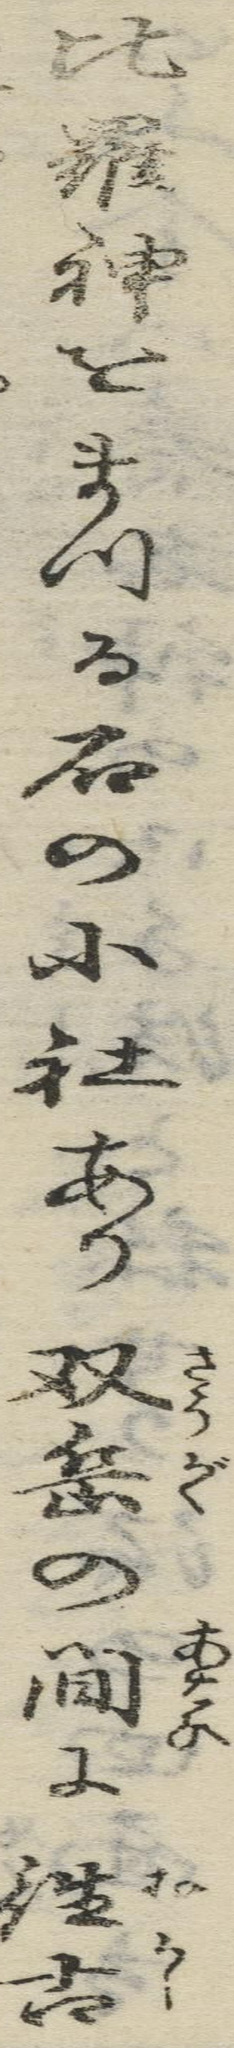比羅守をまつる石の小社あり双岳の間に往古
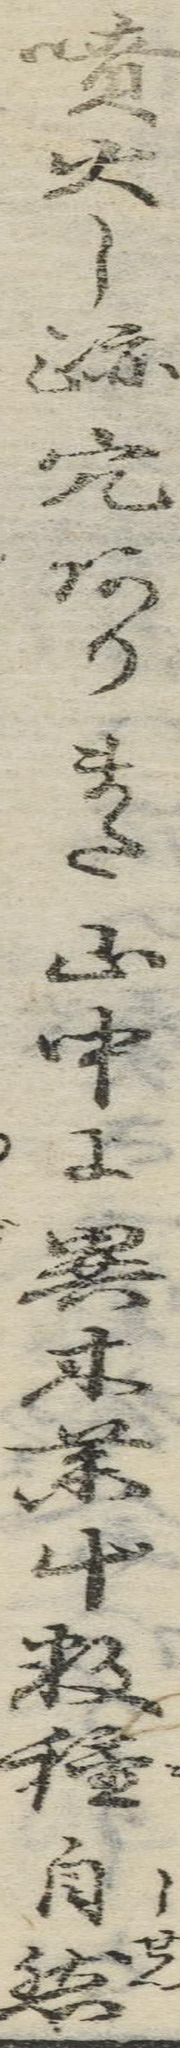噴火し跡穴ありまた山中に異木薬草数種自然
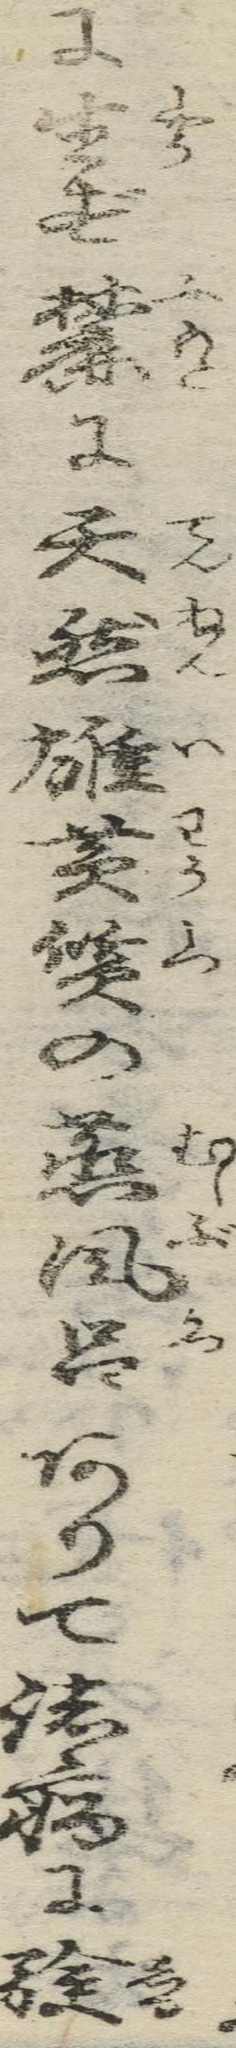に生ず麓に天然硫黄質の蒸風呂ありて諸病に験
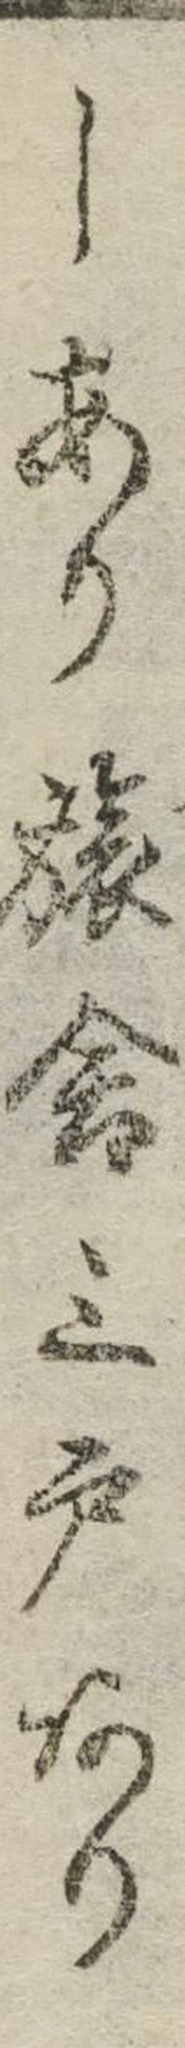しあり旅舎三戸あり
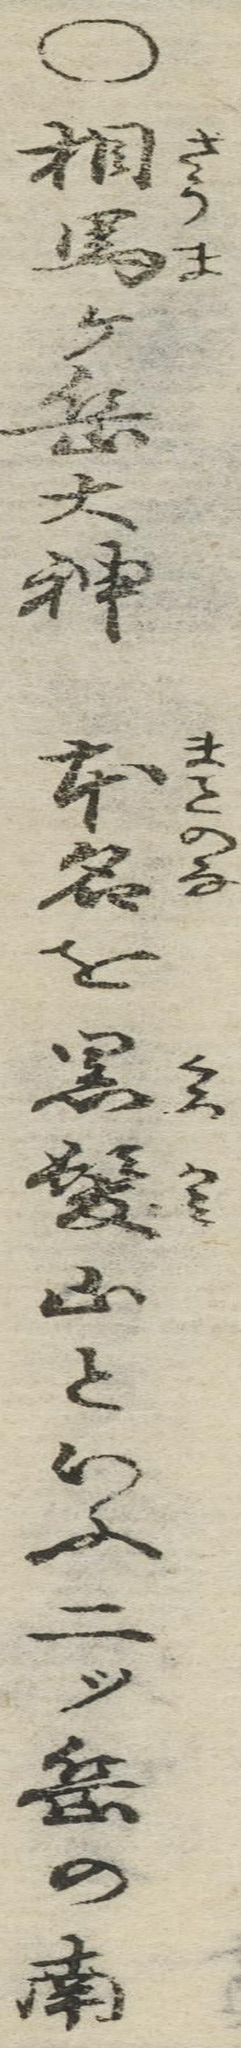○相馬ヶ岳大神本名を黒髪山といふ二ッ岳の南
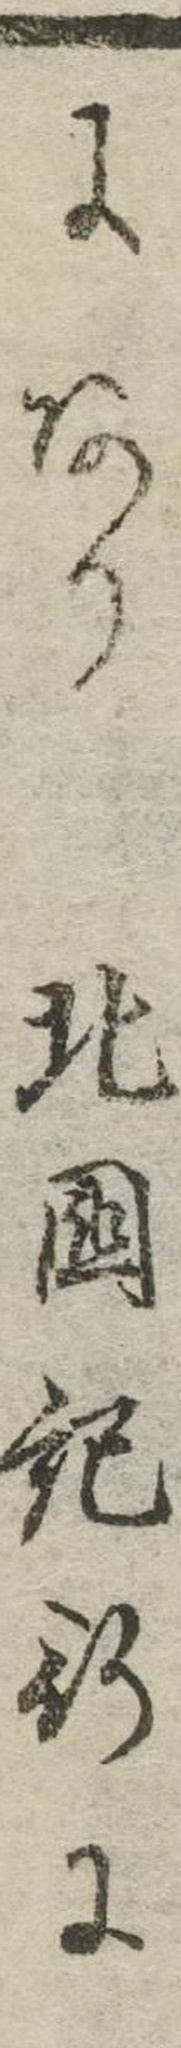にあり北國紀行に
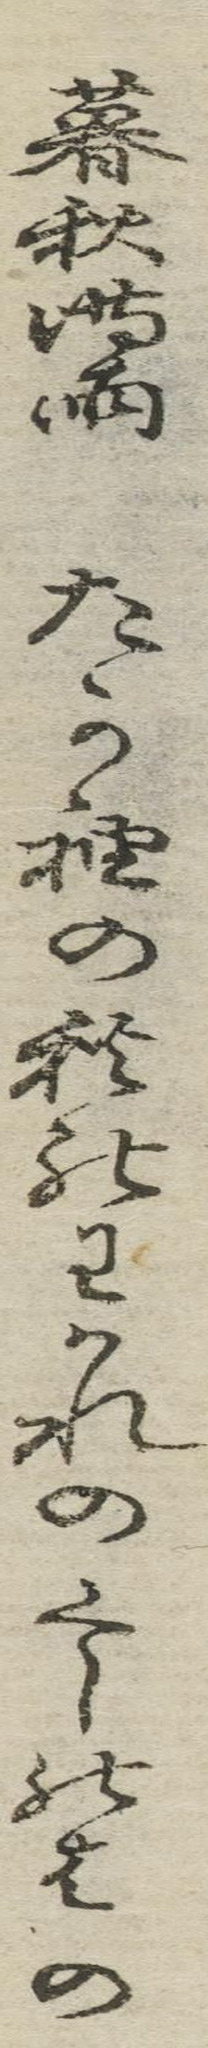暮秋時雨たか袖の秋のわかれのくしのはの
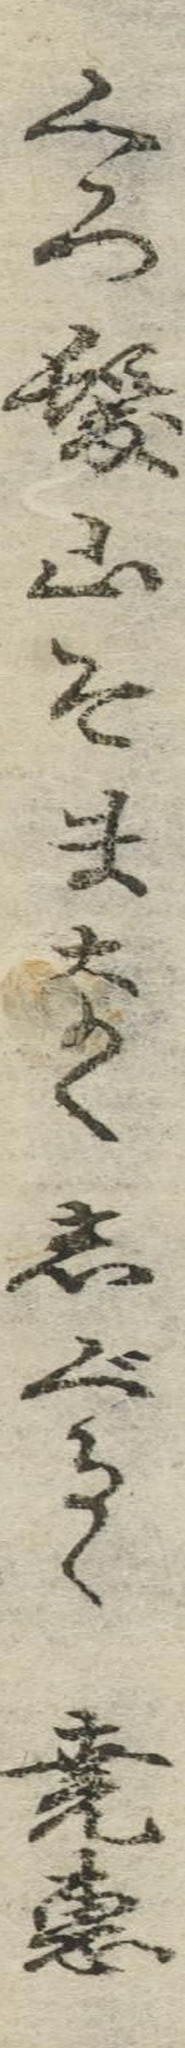くろ髪山そまなくしぐるゝ堯恵
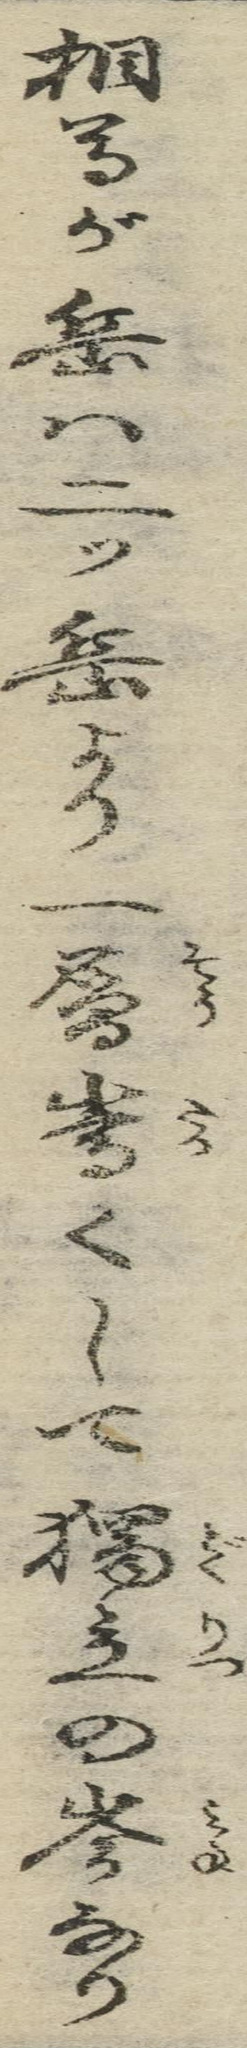相馬が岳は二ッ岳より一層高くして獨立の峯なり

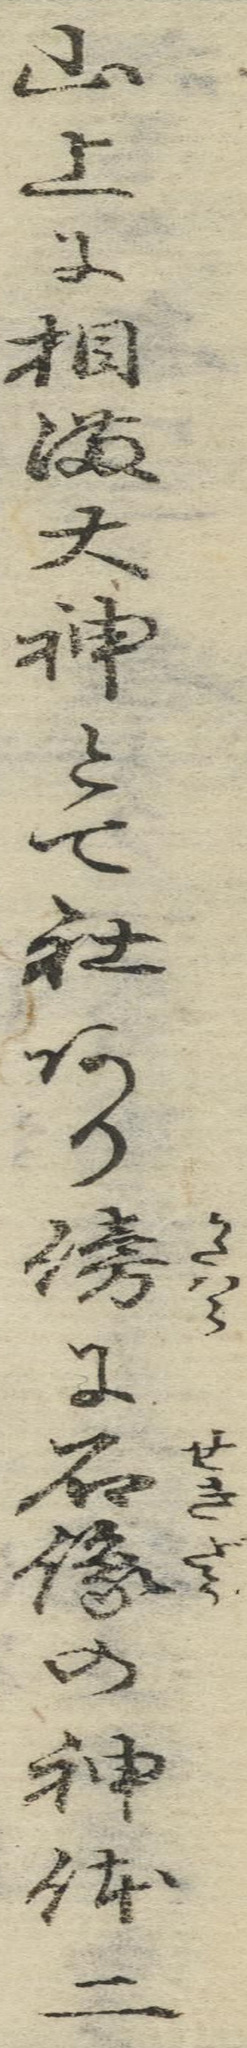山上に相ま大神とて社あり傍に石像の神体二
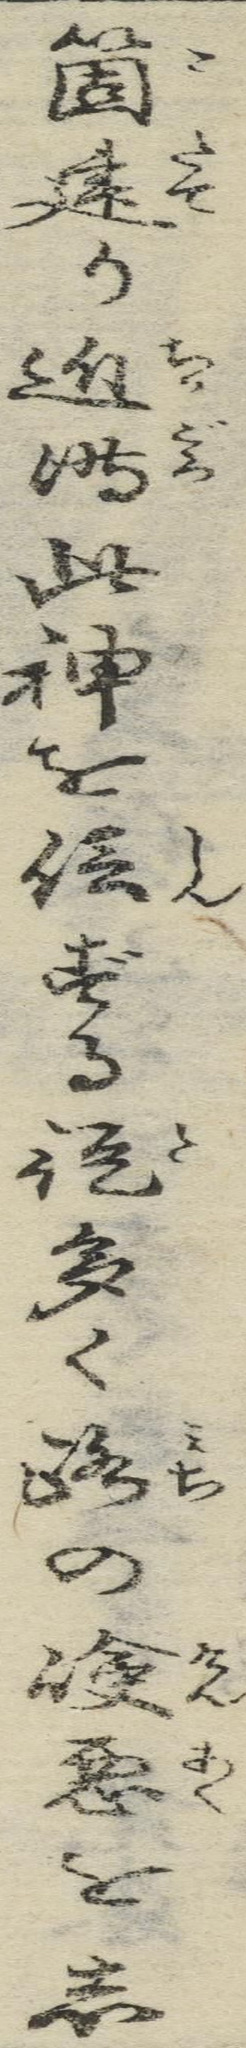箇建り近時此神を信ずる徒多く路の険悪をし
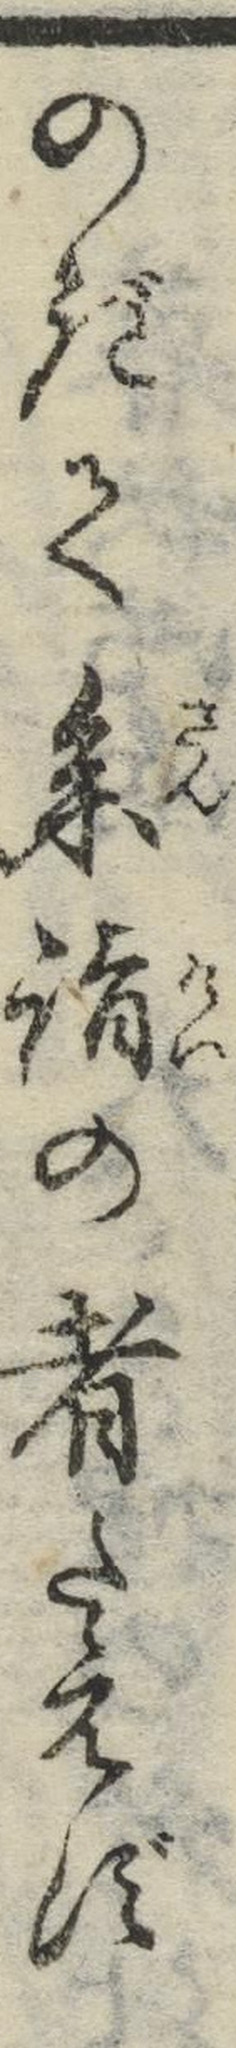のきて参詣の物たえず
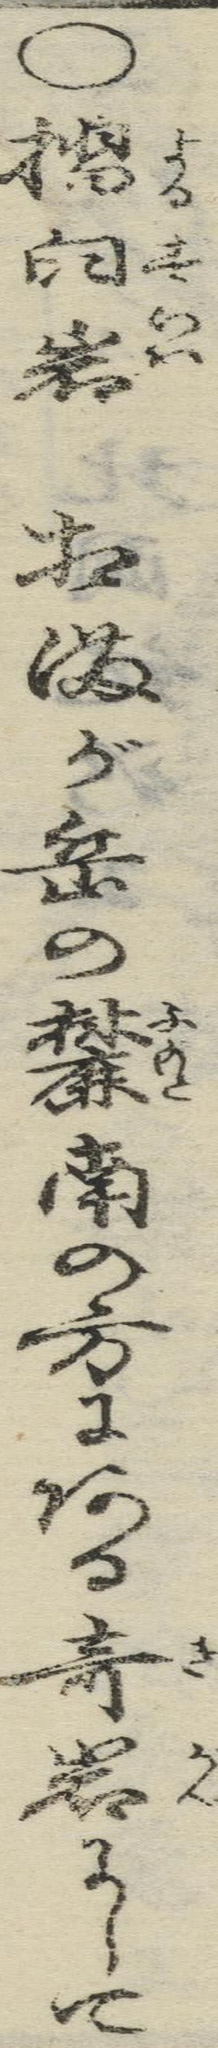○摺臼岩相まが岳の麓南の方にある奇岩にして
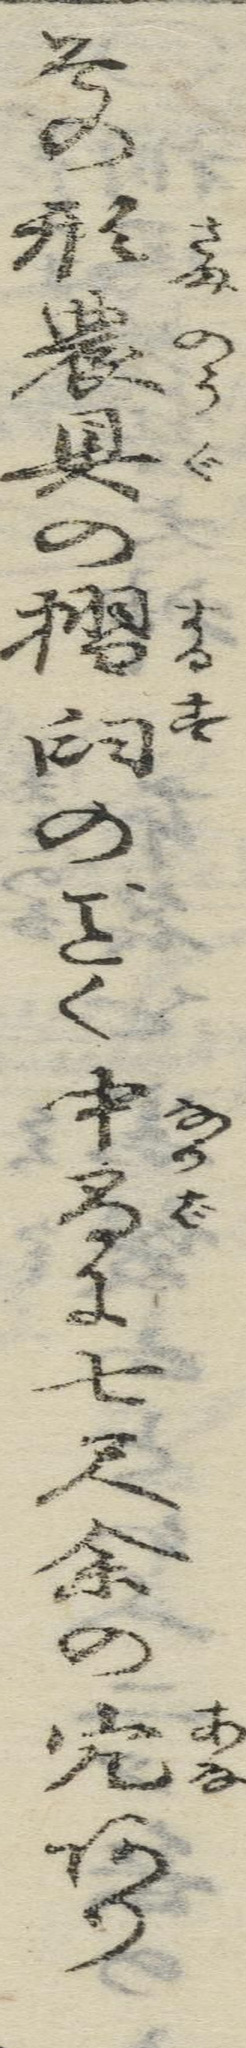その形農具の摺臼のごとく中間に七尺余の穴あり
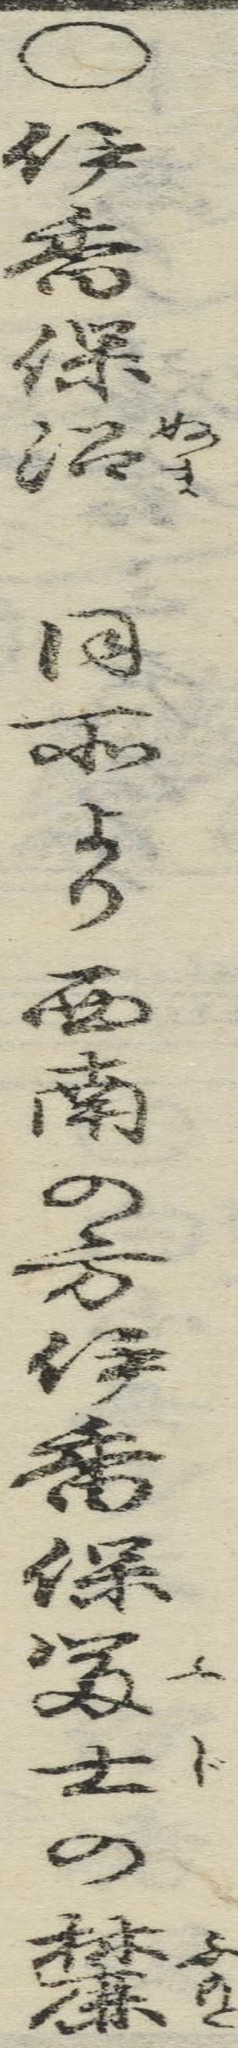○伊香保沼同所より西南の方伊香保冨士の麓
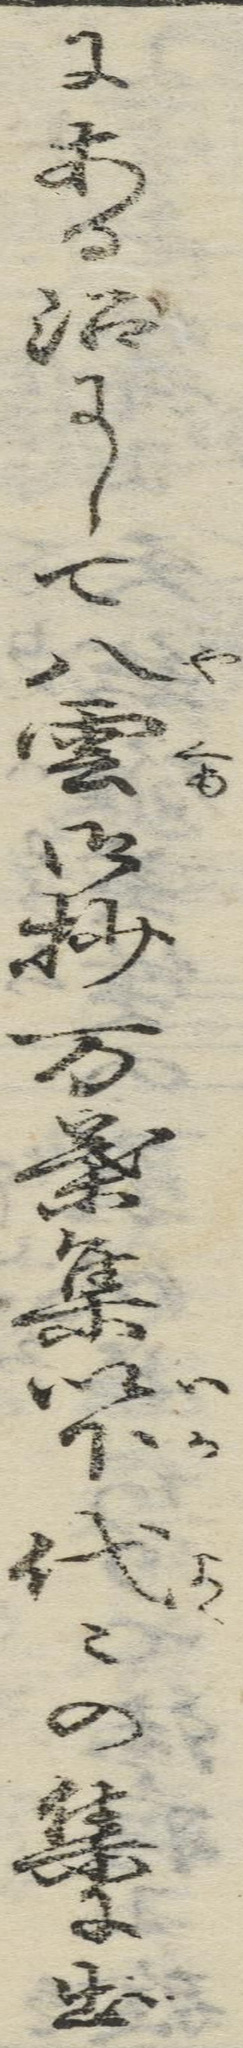にある沼にして八雲御抄万葉集以下代々の集に出
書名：上州伊香保鑛泉圖會　全
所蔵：東京大学地震研究所図書室 Earthquake Research Institute Library, The University of Tokyo, JAPAN
